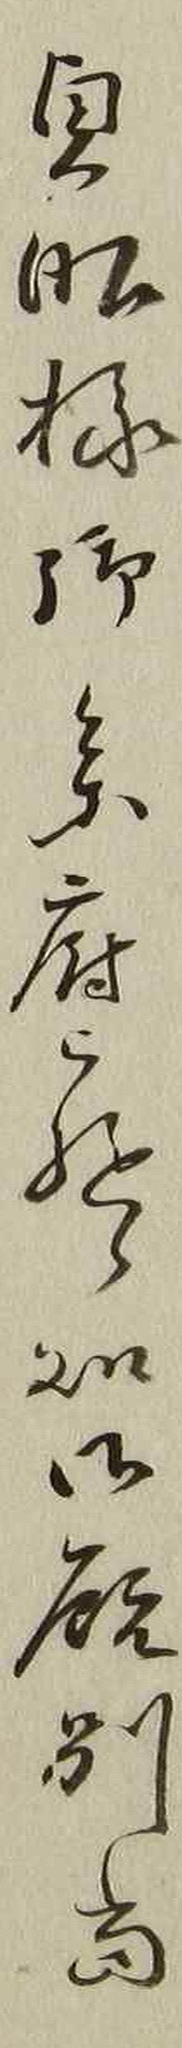貞昭様御参府被遊候処御厩別当
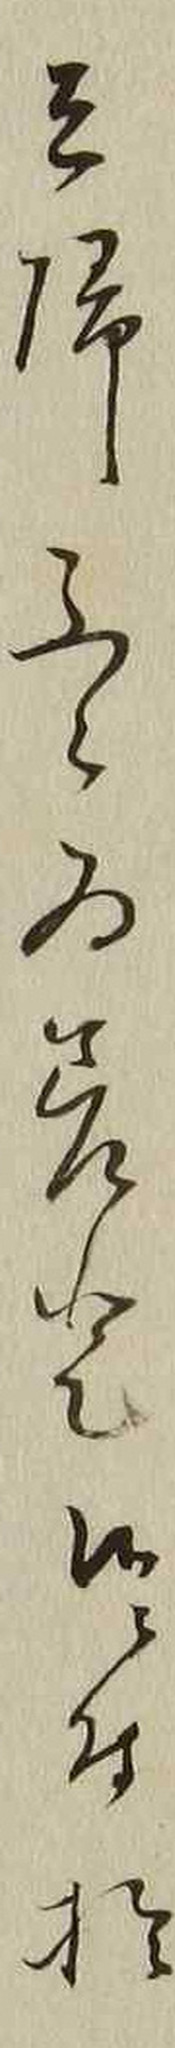立帰ふと為差登候ニ付於
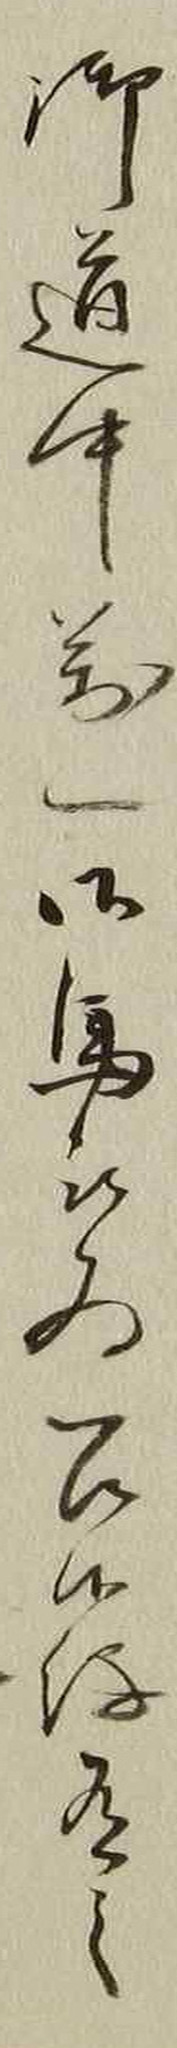御道中万一御馬被為召儀有之
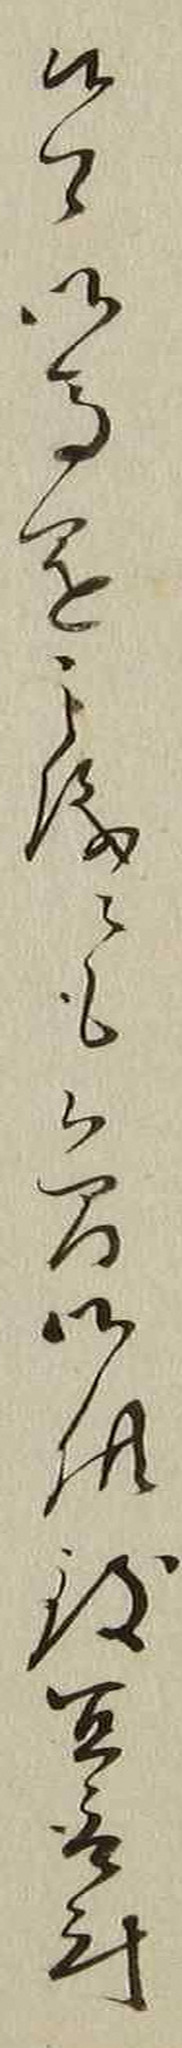候ハヽ御馬懸之儀ニも候間御供致宜取計
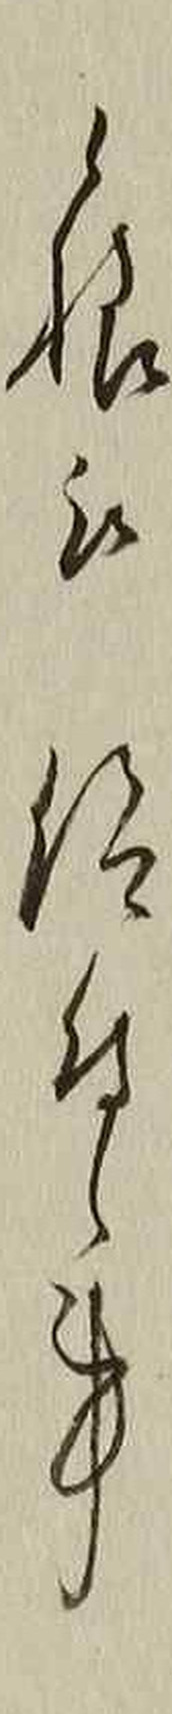候様被仰付候事
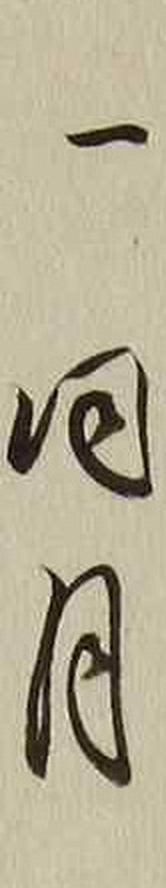一同月
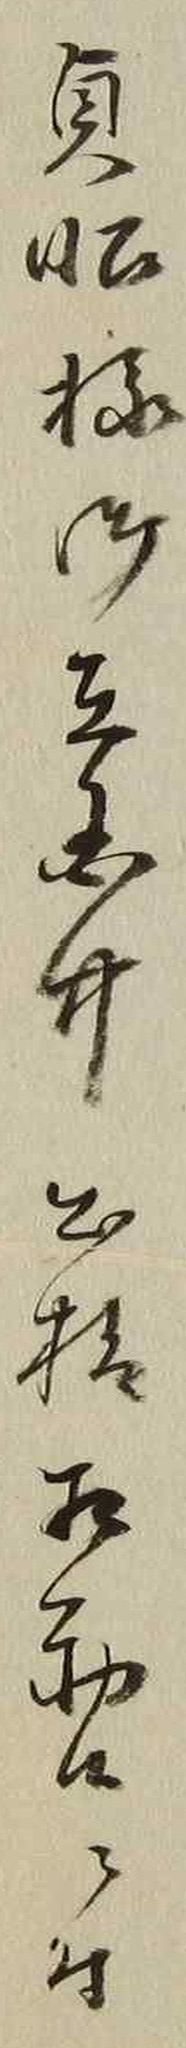貞昭様御在国中出精相勤候ニ付
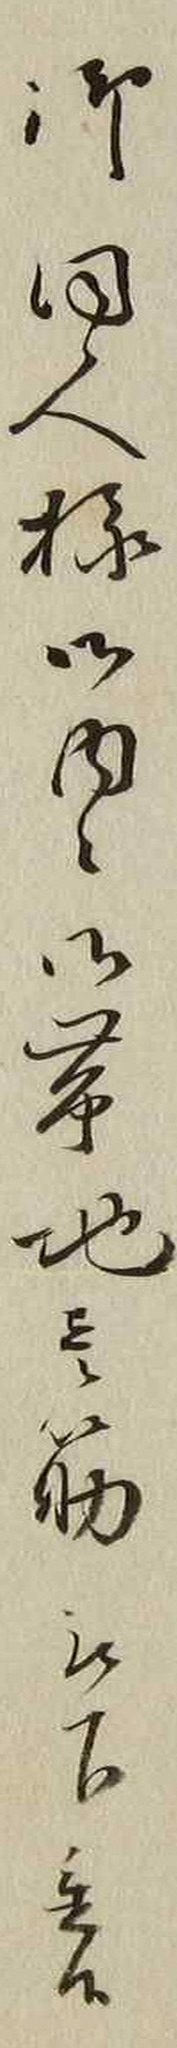御同人様御内々御帯地壱筋被下置候
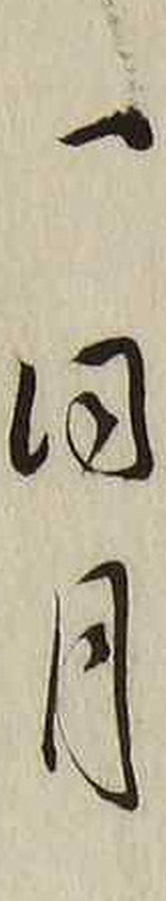一同月
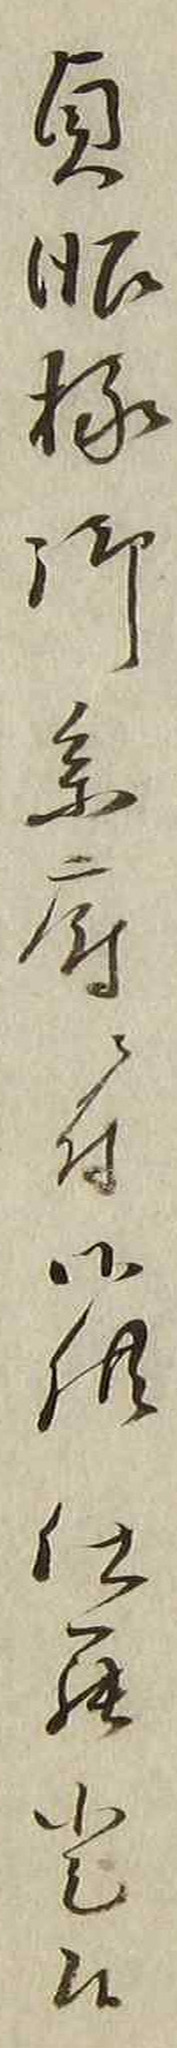貞昭様御参府ニ付御供仕罷登候
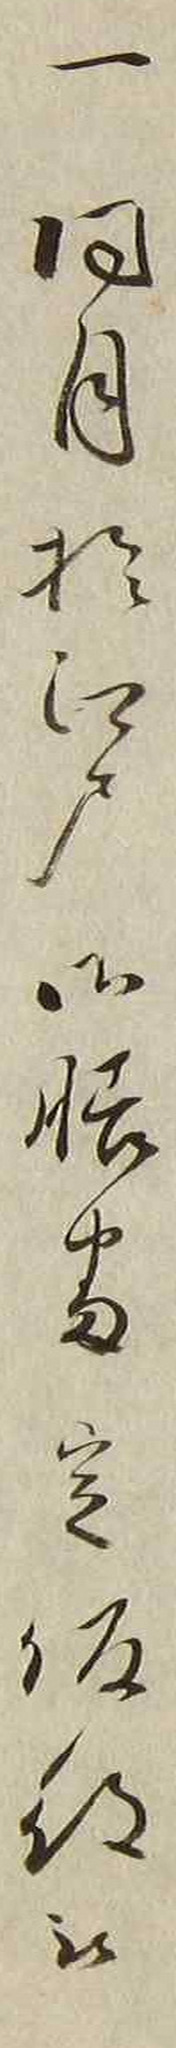一同月於江戸御膳番定仮役被
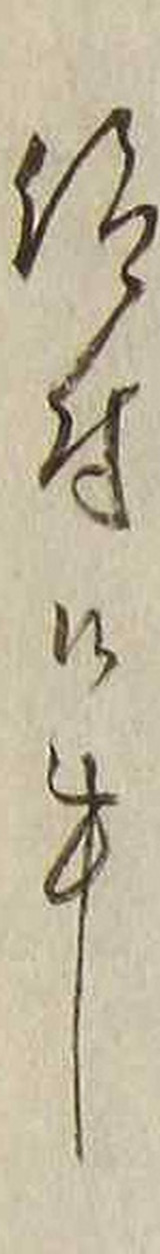仰付候事

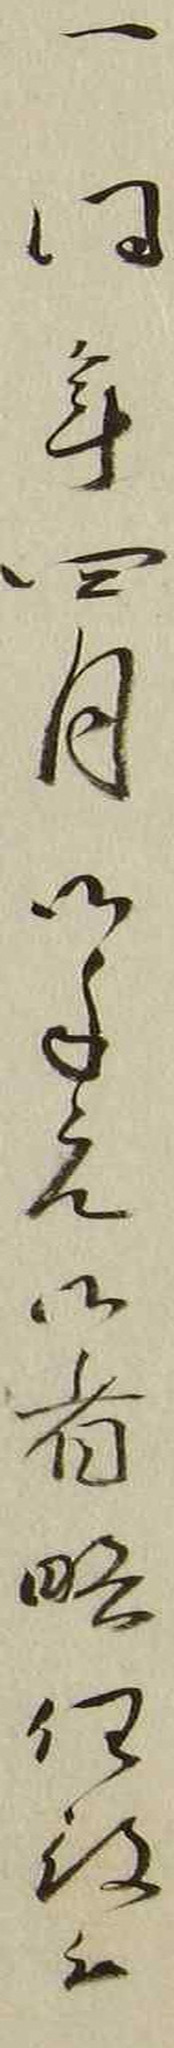一同年四月御手元御省略任役被
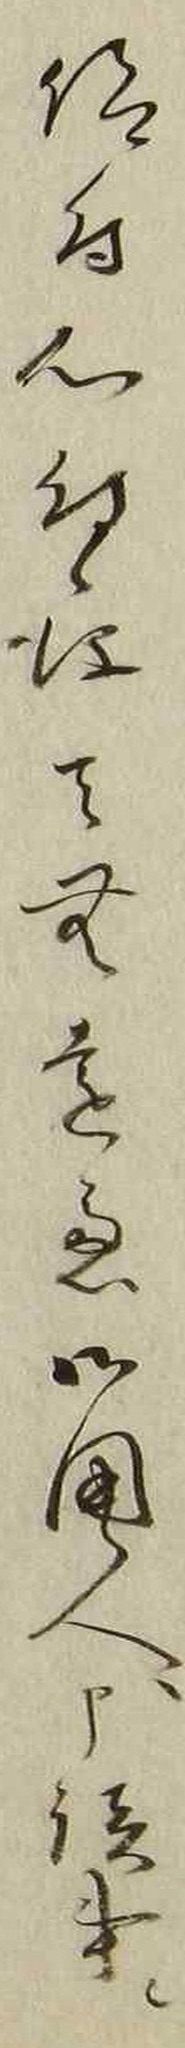仰付心付候儀者無遠慮御用人へ申談事ニ
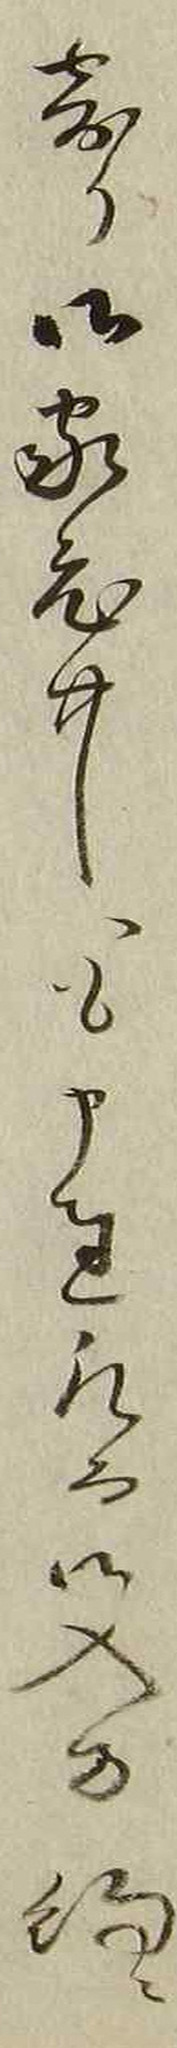寄り御家老中へも申達凡而御入方約ニ
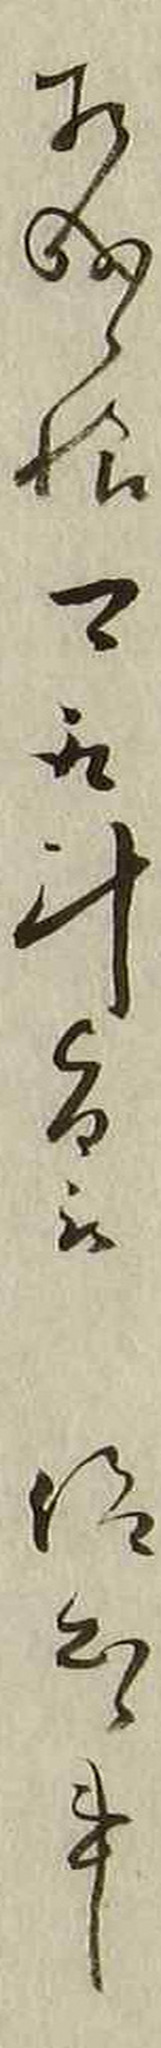相成候様可取計旨被仰出候事
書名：諸士系譜　巻之25　い之部25
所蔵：会津若松市立会津図書館
